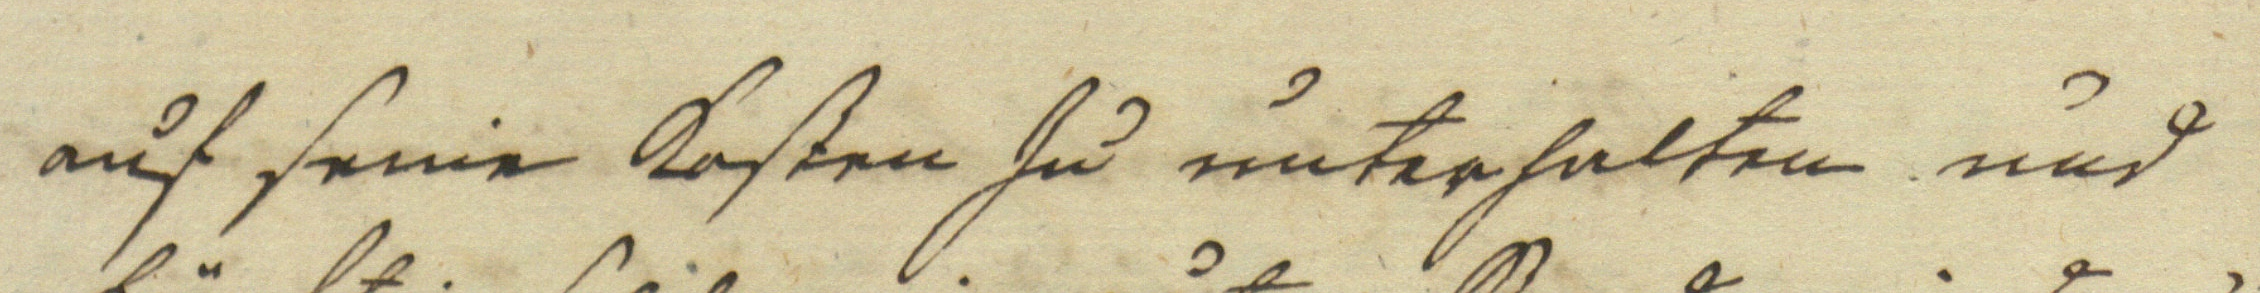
auf seine Kosten zu unterhalten und
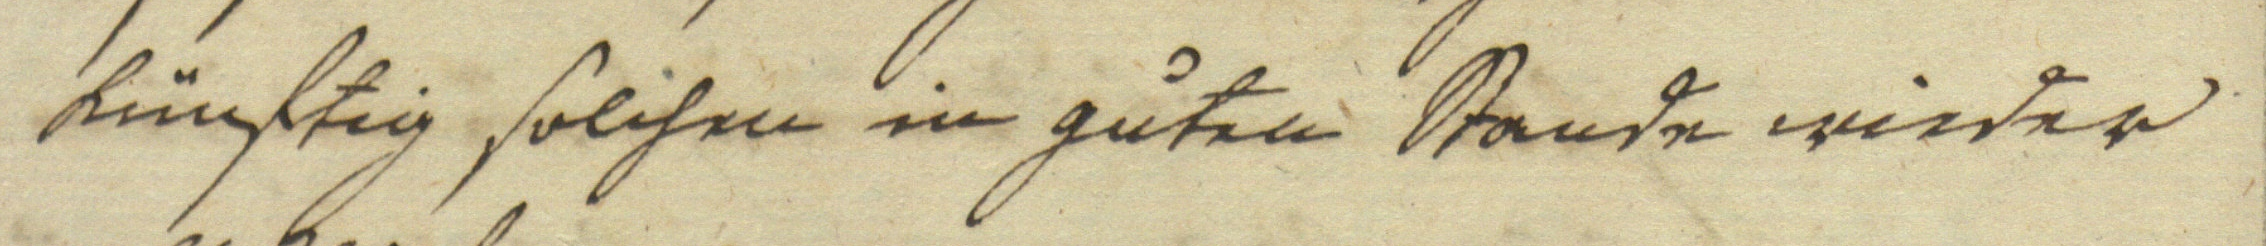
künftig solchen in gutem Stande wieder
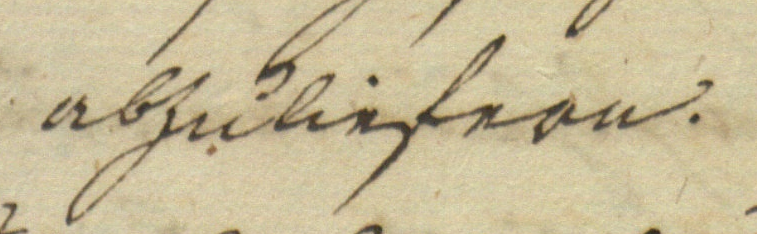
abzuliefern.
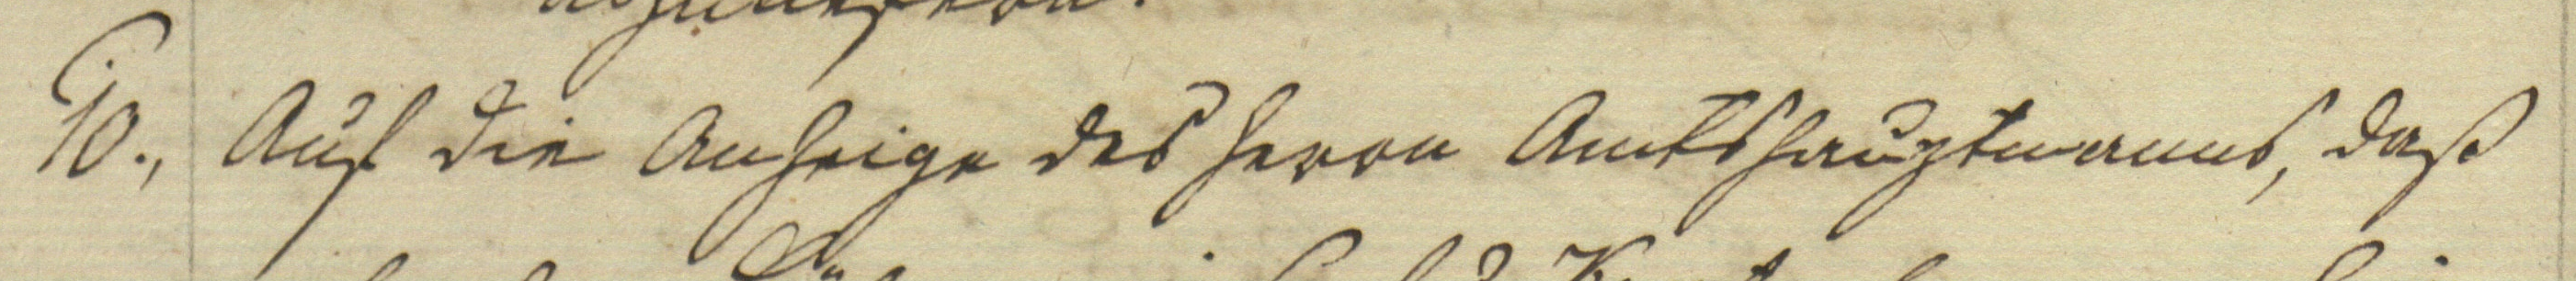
10. Auf die Anzeige des Herrn Amtshauptmanns, daß
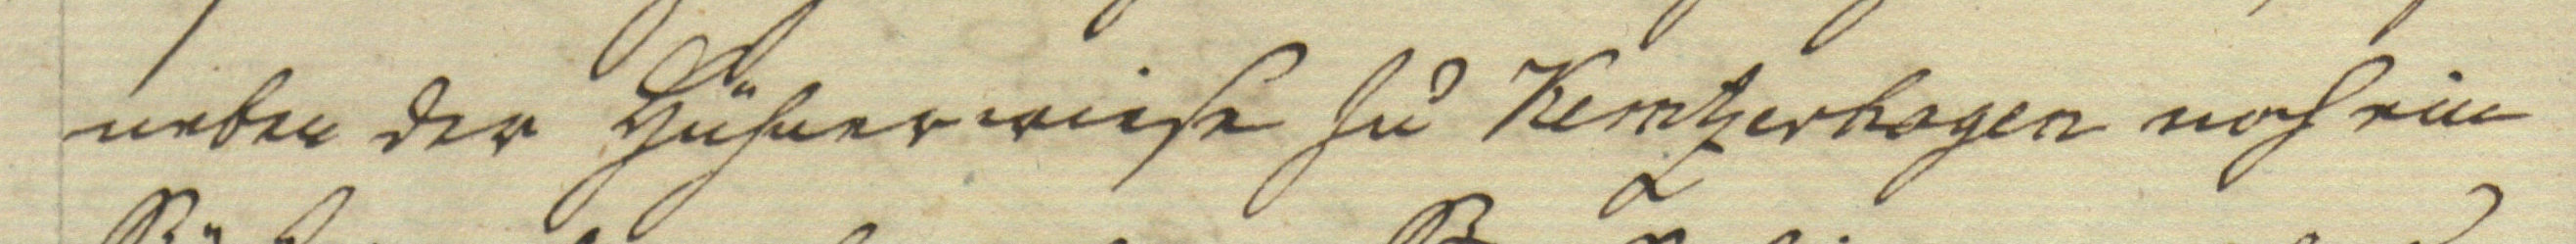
neben der Hühnerwiese zu Kemtzerhagen noch ein
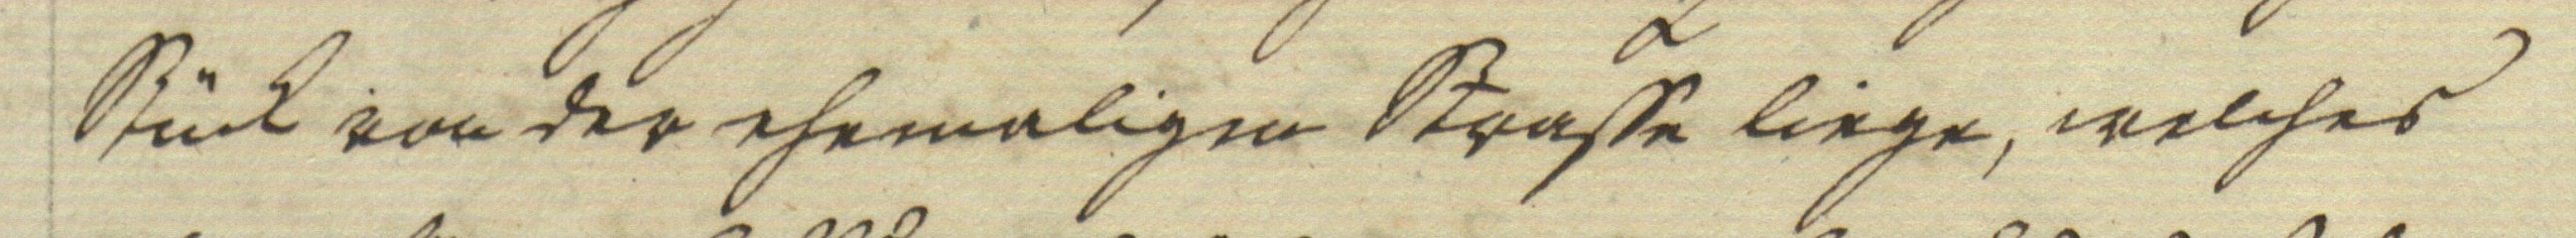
Stück von der ehemaligen Strasse liegen, welches
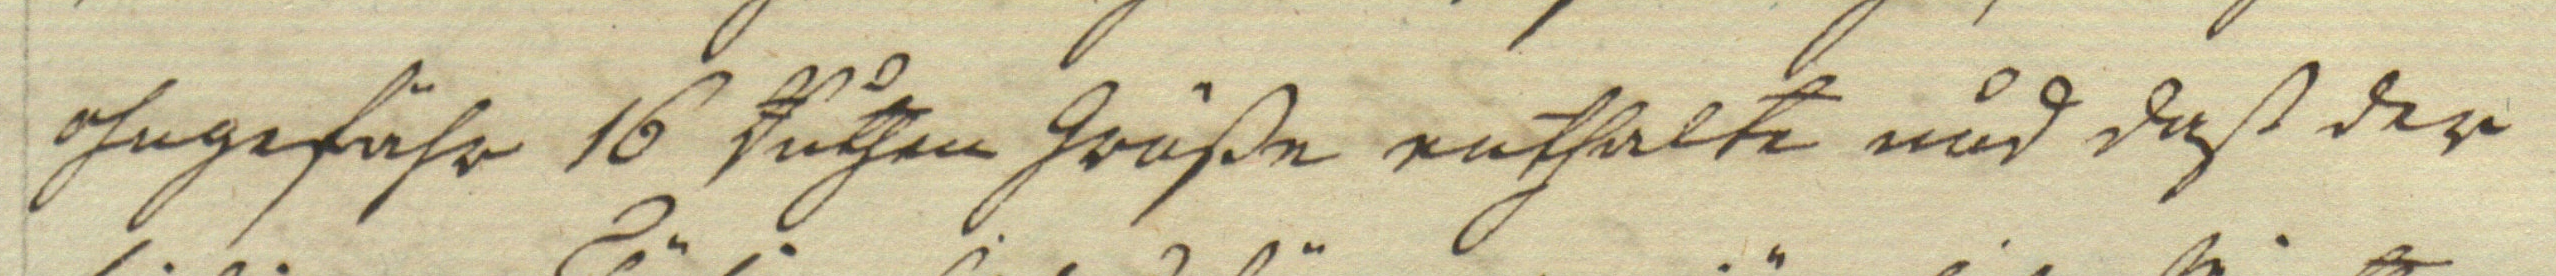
ohngefähr 16 Ruthen Grösse enthalte und daß der
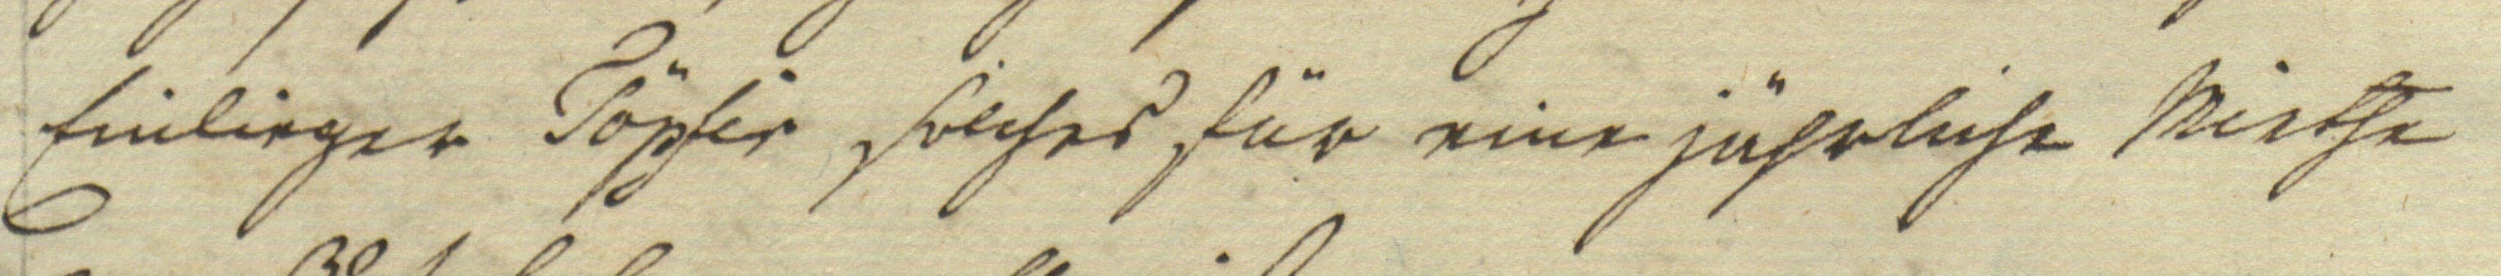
Einlieger Töpfer solches für eine jährliche Miethe
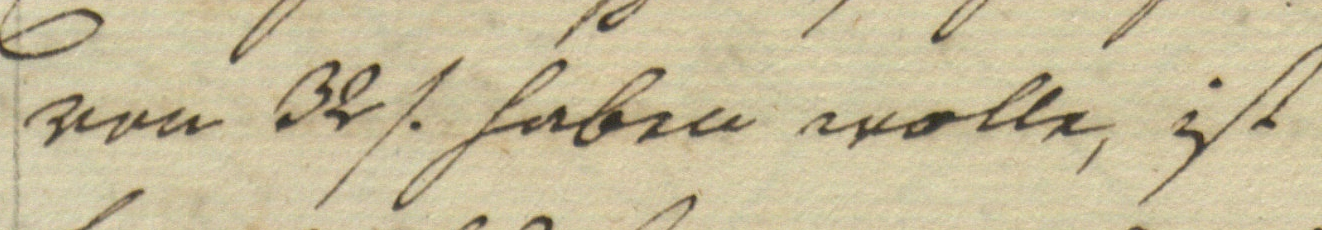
von 32 s. haben wolle, ist
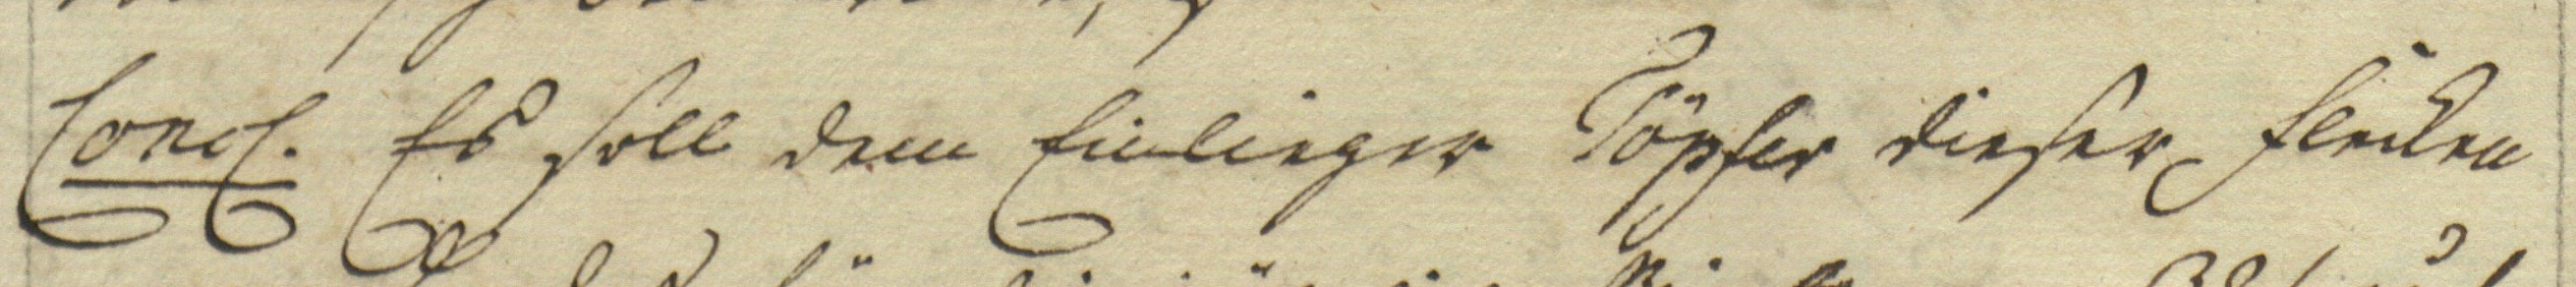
Concl. Es soll dem Einlieger Töpfer dieser Flecken
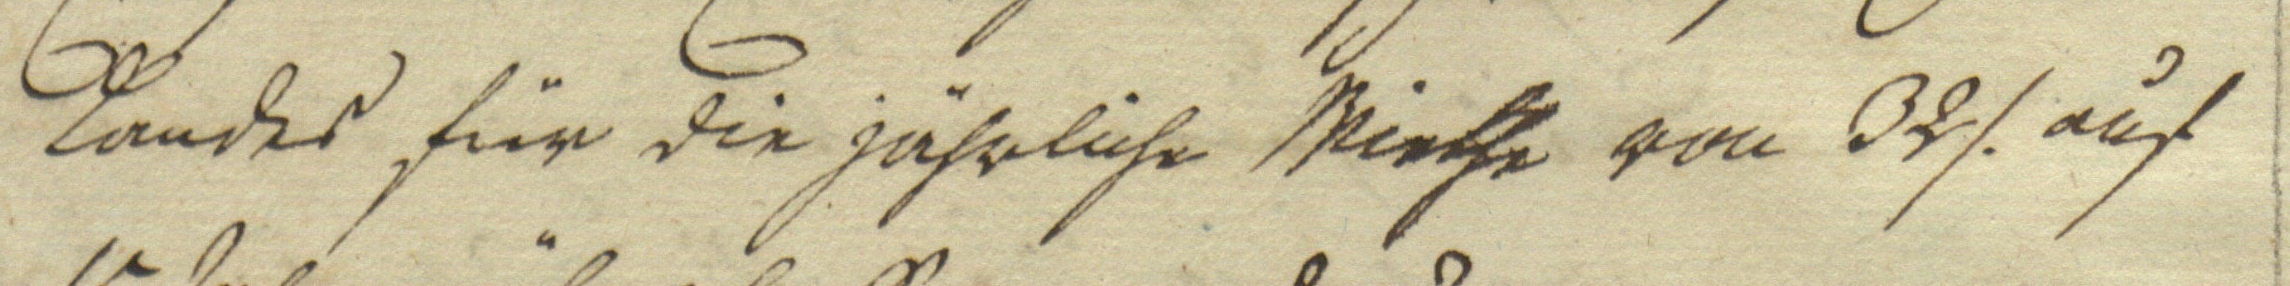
Landes für die jährliche Miethe von 32 s. auf
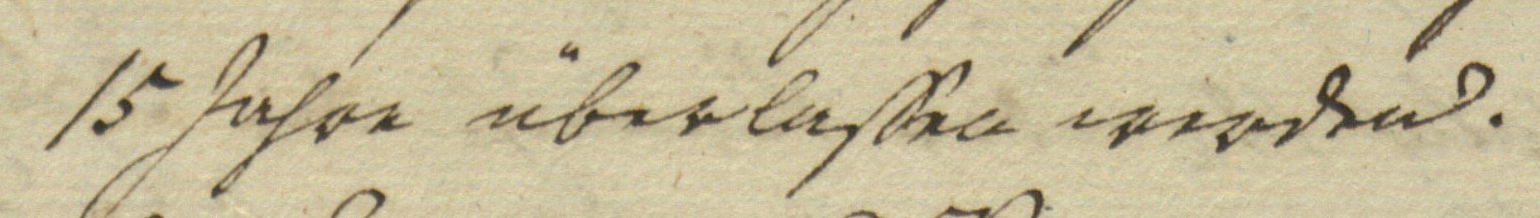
15 Jahre überlassen werden.
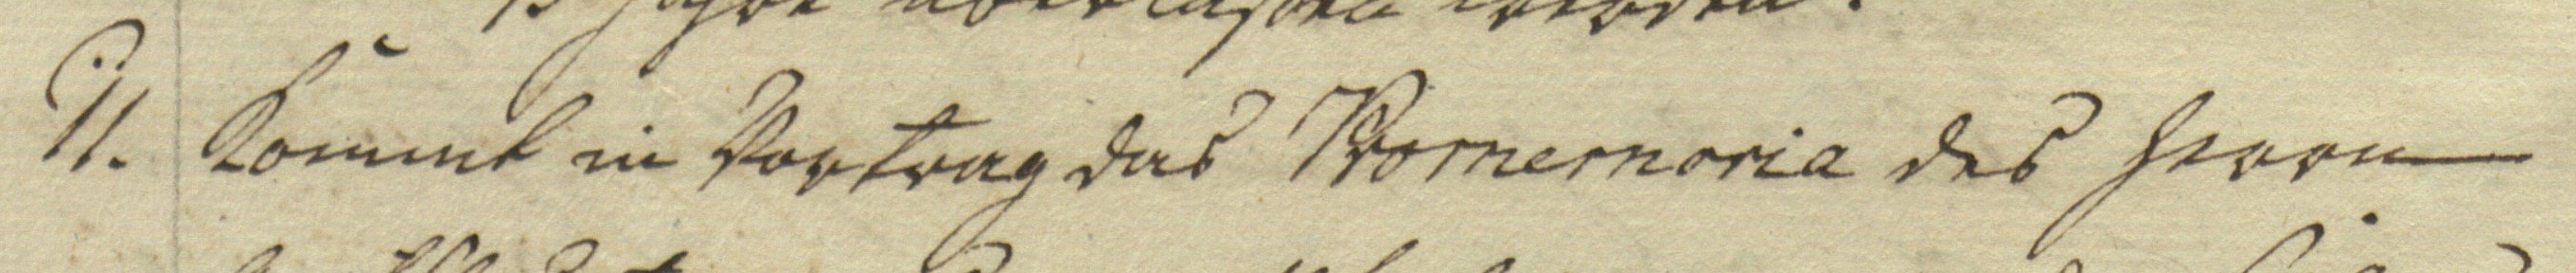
11. Kommt in Vortrag das Promemoria des Herrn
